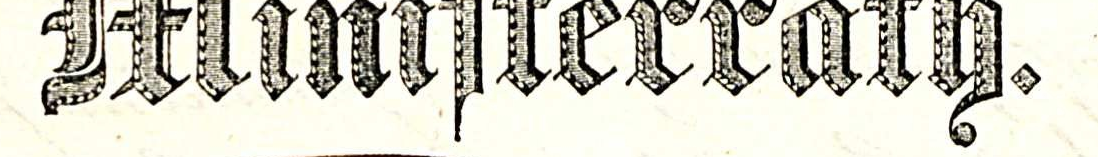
Ministerrath
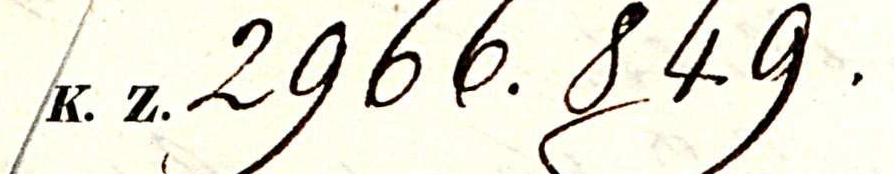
KZ 2966. 849
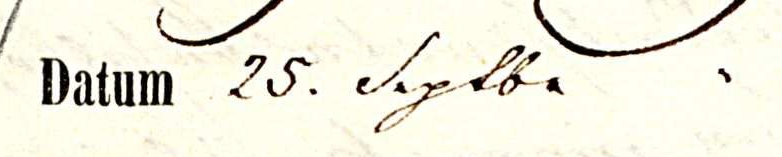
Datum 25 Septbr
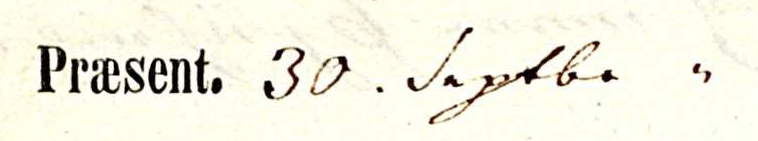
Praesent. 30 Septbr
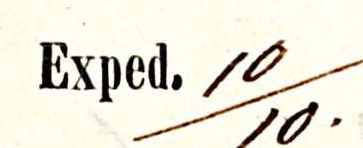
Exped. 10/
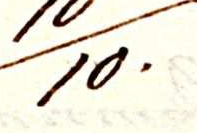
10
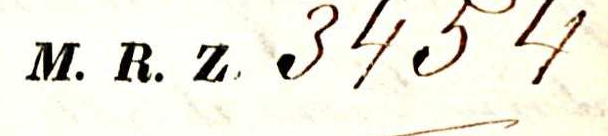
MRZ 3454/
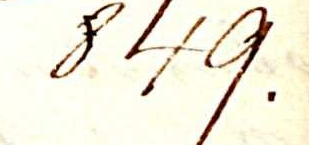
849
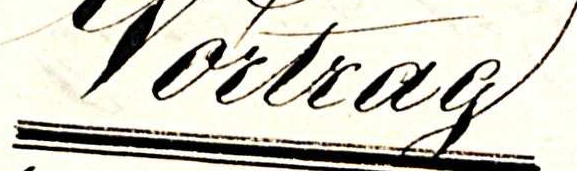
Vortrag
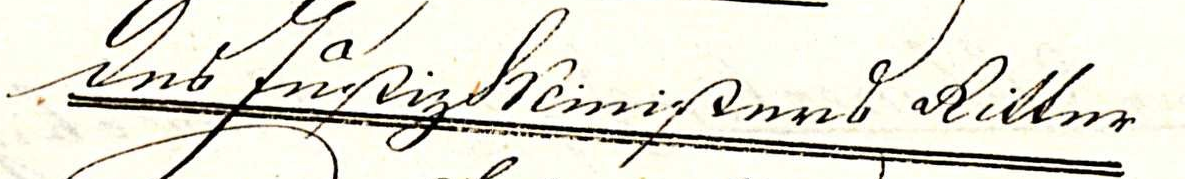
des Justiz Ministers Ritter
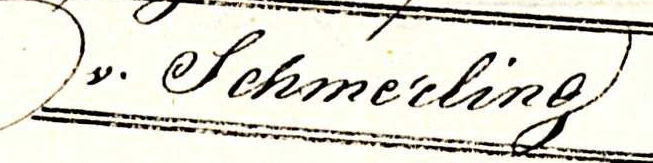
v. Schmerling
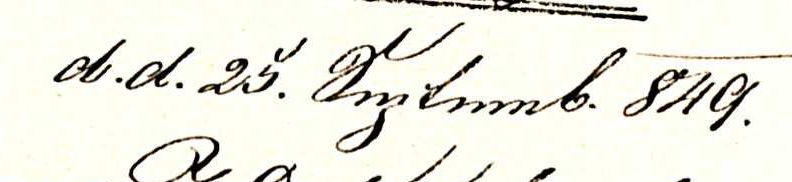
d.d. 25. September 849
